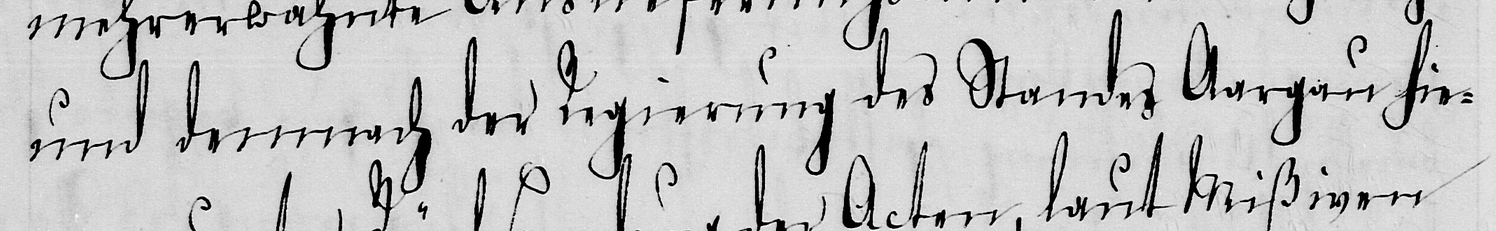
und demnach der Regierung des Standes Aargau hie¬
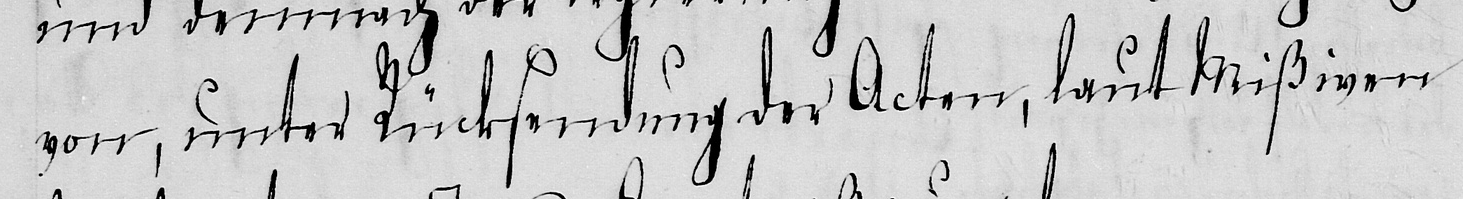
von, unter Rücksendung der Acten, laut Mißiven
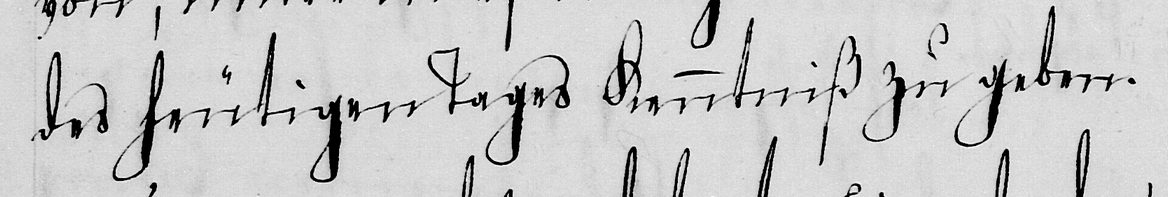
des heutigen Tages Kenntniß zu geben.
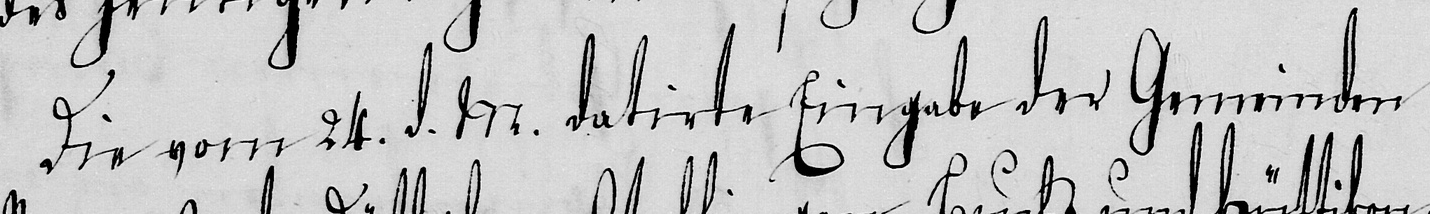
Die vom 24. d. M. datirte Eingabe der Gemeinden
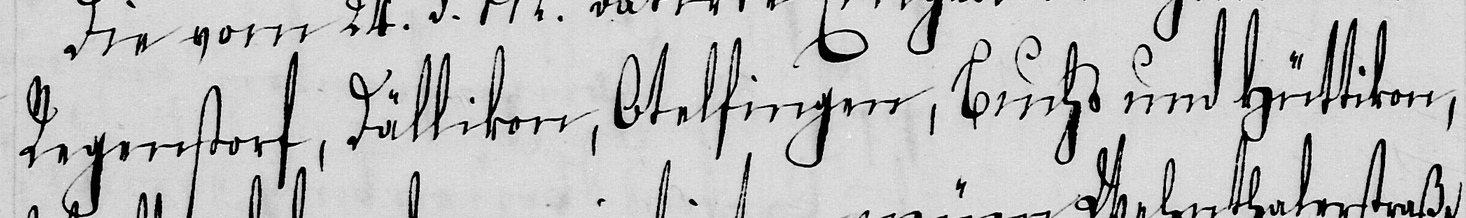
Regenstorf, Dällikon, Otelfingen, Buchs und Hüttikon,
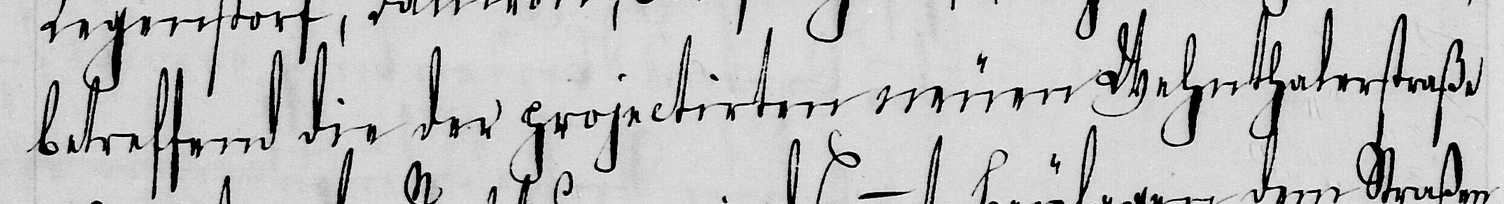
betreffend die der projectionirten neuen Wehnthalerstraße
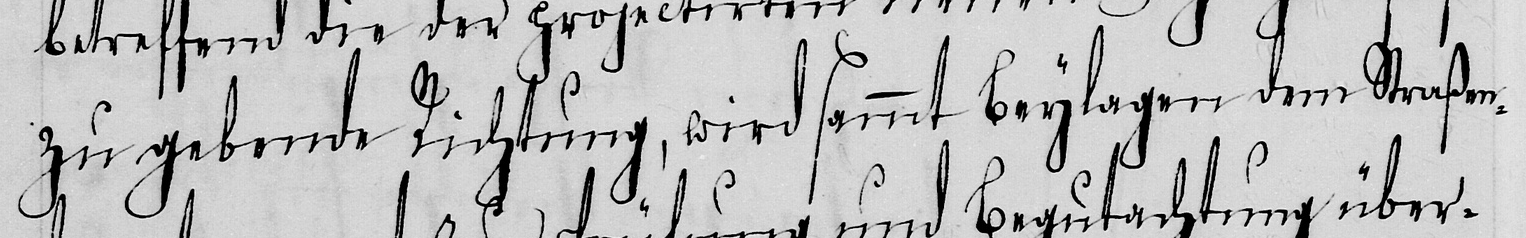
zu gebende Richtung, wird sammt Beylagen dem Straßen¬
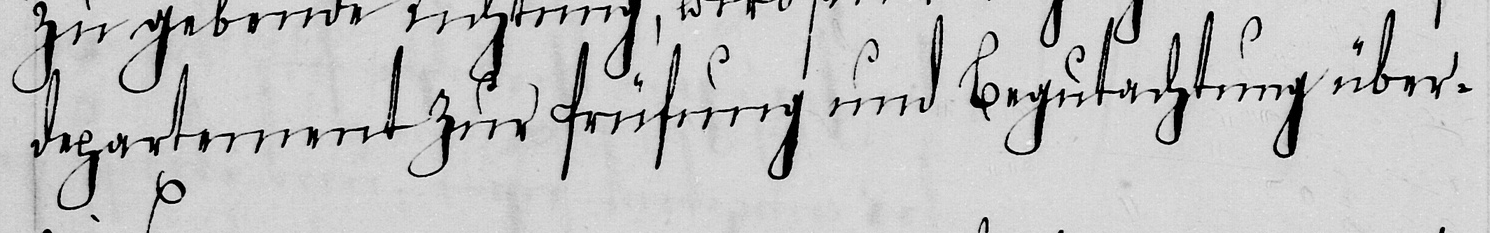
departement zur Prüfung und Begutachtung über¬
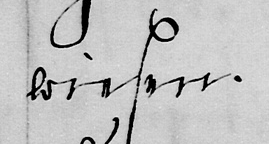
wiesen.
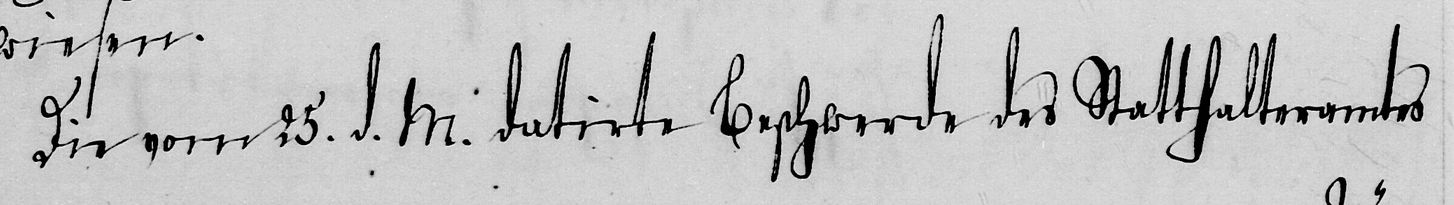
Die vom 25. d. M. datirte Beschwerde des Statthalteramt¬
